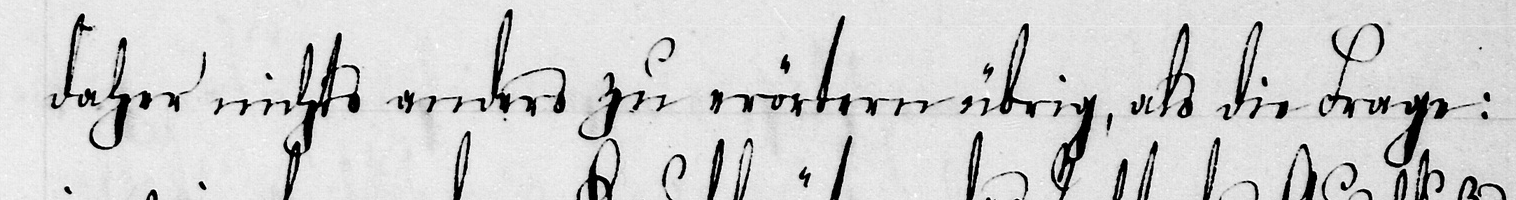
daher nichts anders zu erörtern übrig, als die Frage:
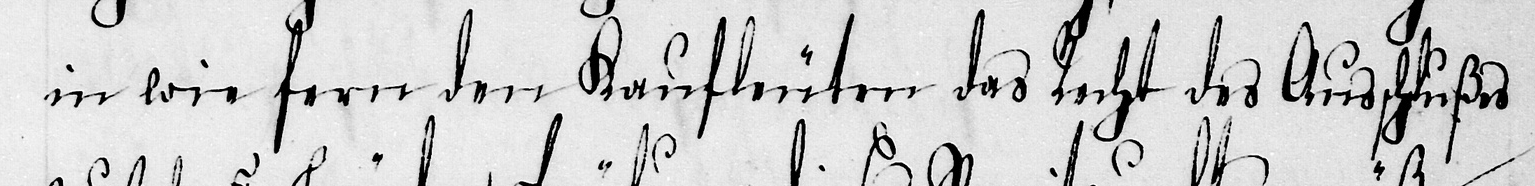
in wie fern den Kaufleuten das Recht des Ausschußes
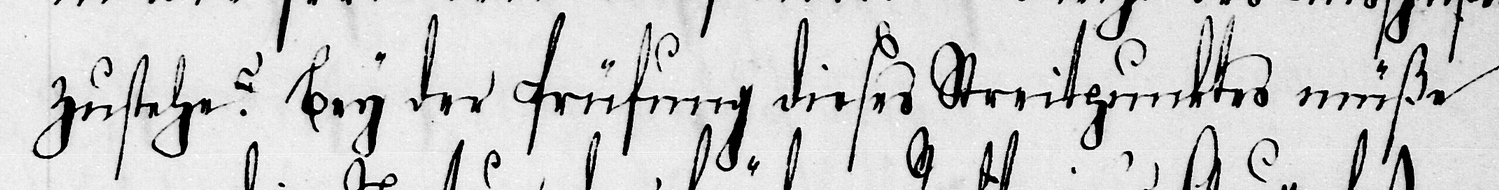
zustehe? Bey der Prüfung dieses Streitpunktes müße
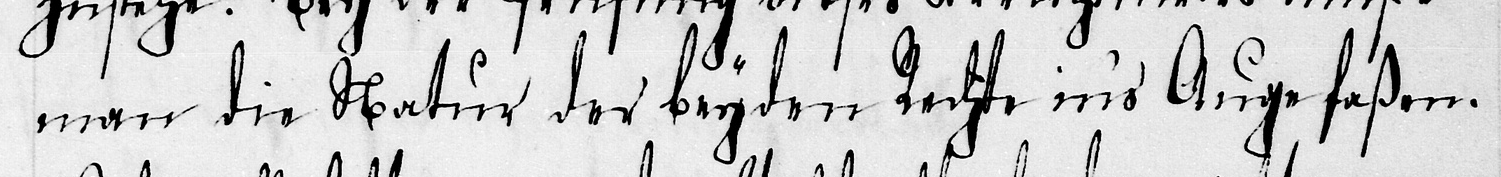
man die Natur der beyden Rechte in’s Auge faßen.
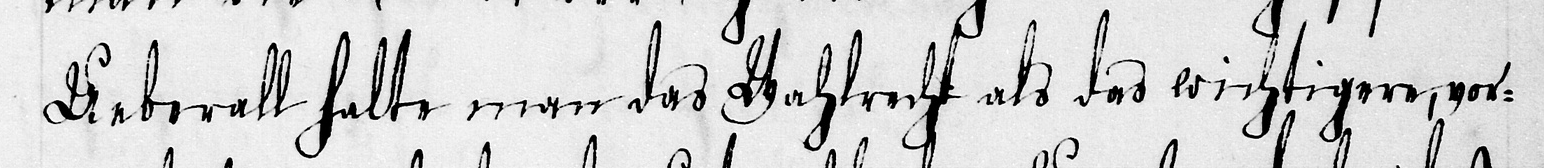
Ueberall halte man das Wahlrecht als das wichtigere, vor¬
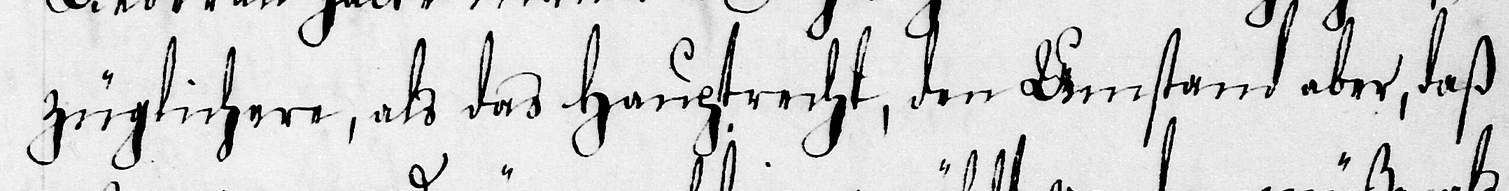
züglichere, als das Hauptrecht, den Umstand aber, daß
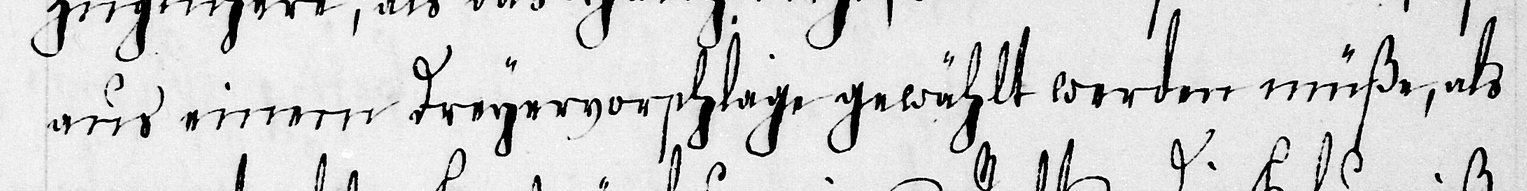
aus einem Dreyervorschlage gewählt werden müße, als
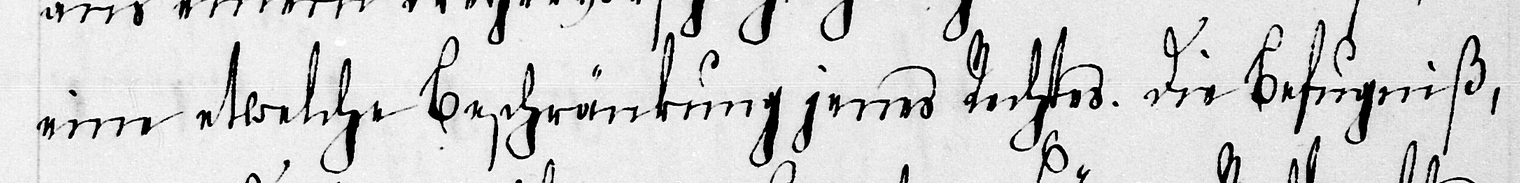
eine etwelche Beschränkung jenes Rechtes. Die Befugniß,
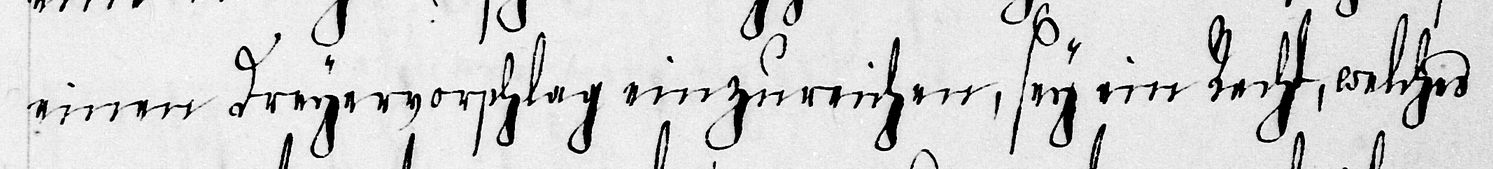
einen Dreyervorschlag einzureichen, sey ein Recht, welches
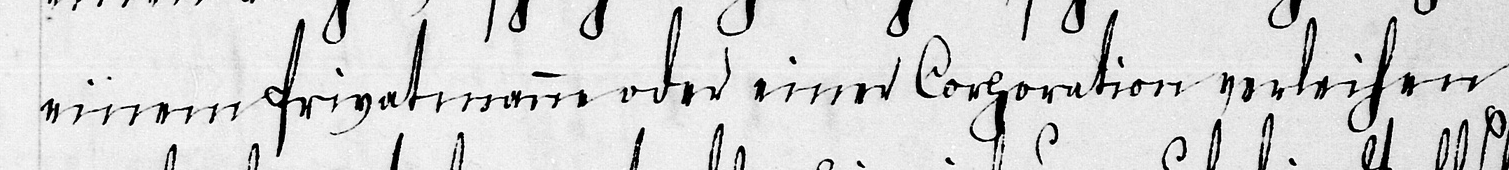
einem Privatmanne oder einer Corporation verleihen
